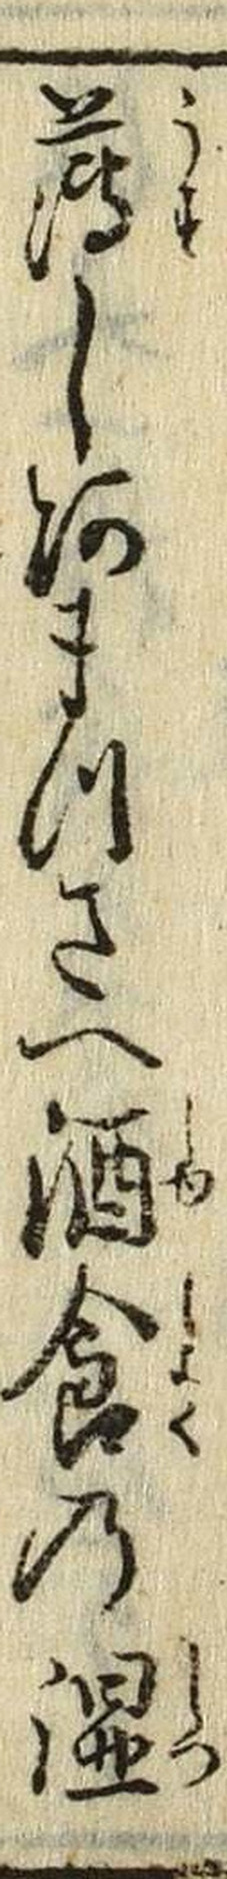薄しあまつさへ酒食の湿
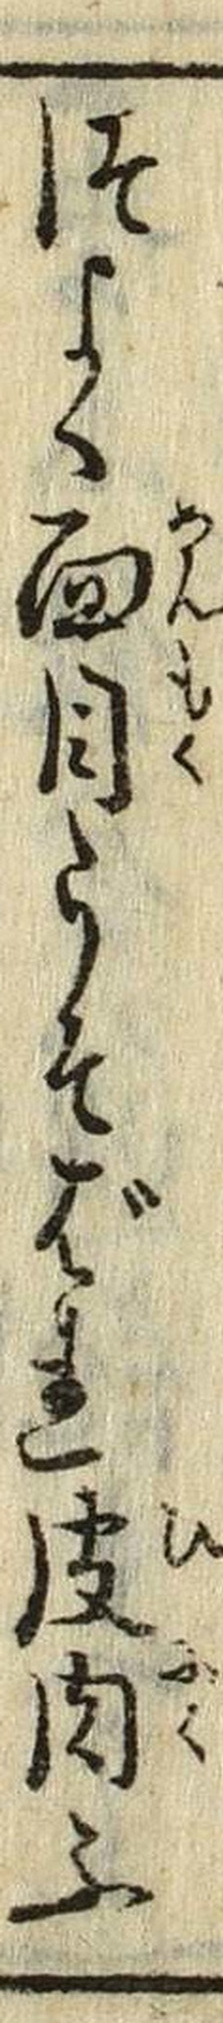つよく面目うそばれ皮肉ふ
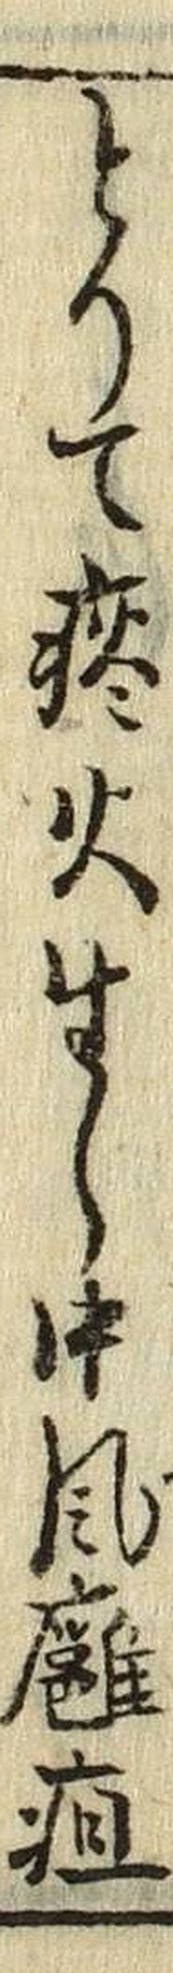とりて痰火生し中風癰疽
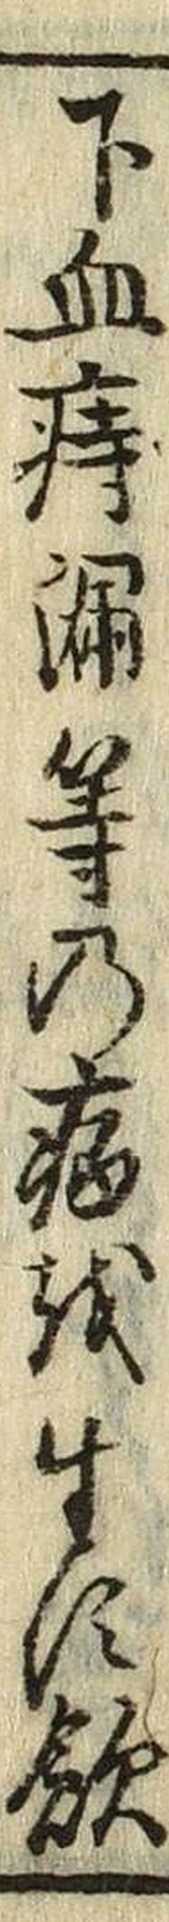下血痔漏等の病を生す飲
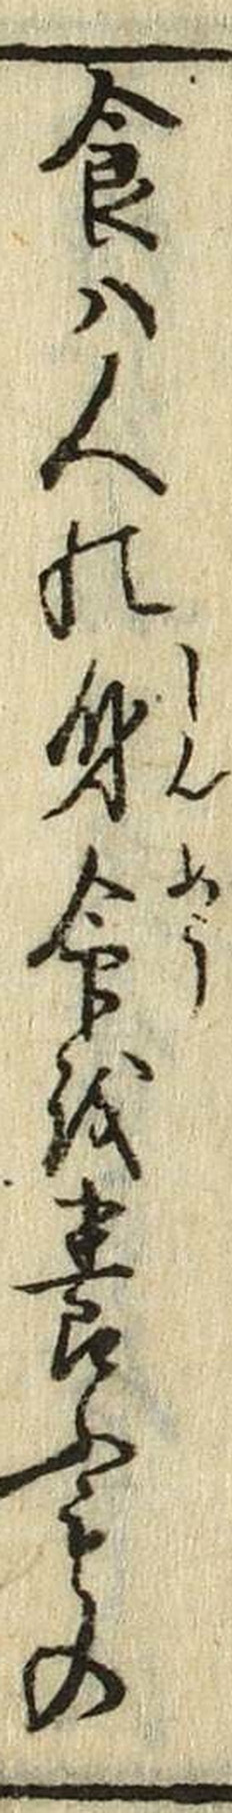食は人の身命を養ふもの
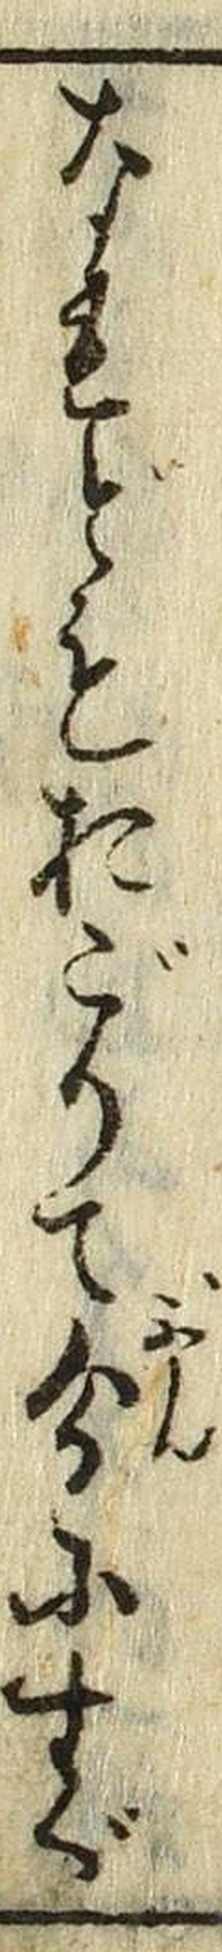なれどもおごりて分にすぐ
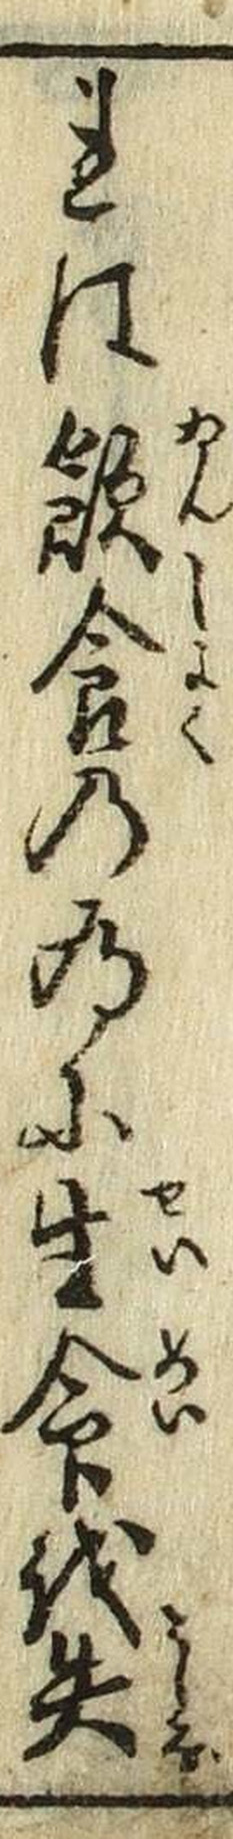れは飲食の為に生命を失
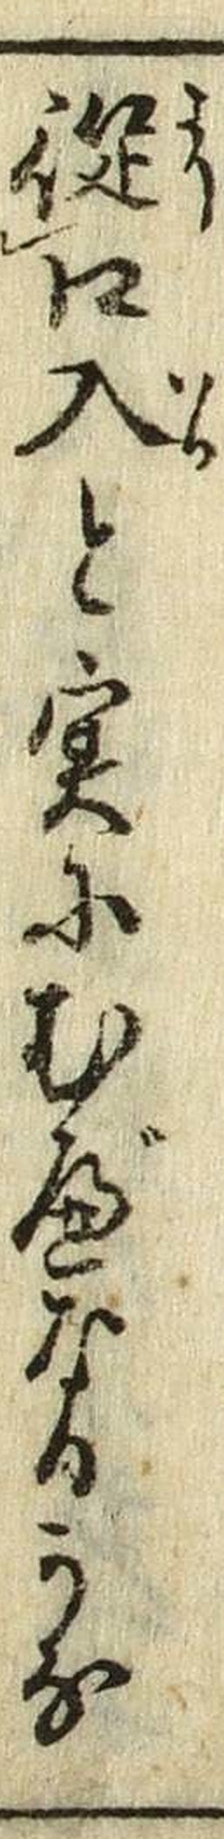従口入と実にむべなるかな
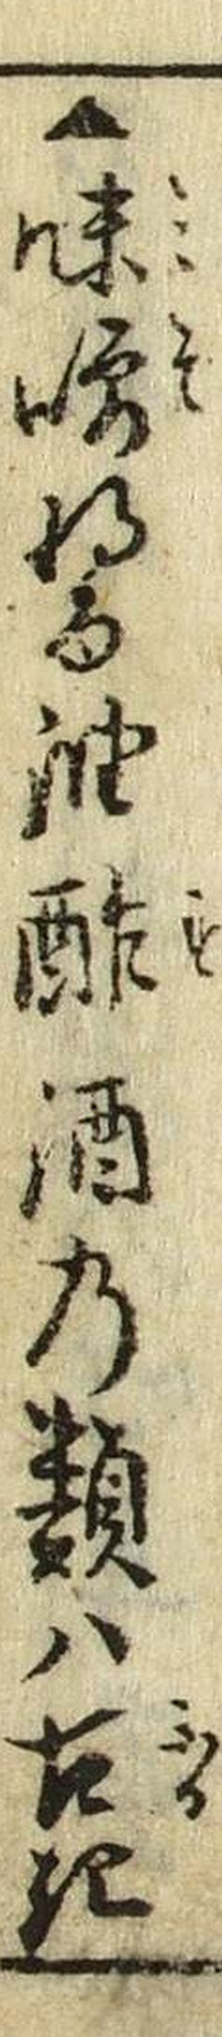味噌醤油酢酒の類は古き

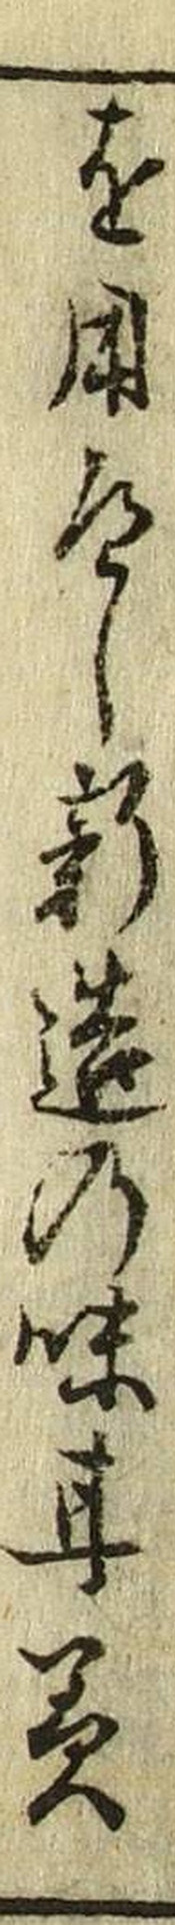を用へし新造の味甘美
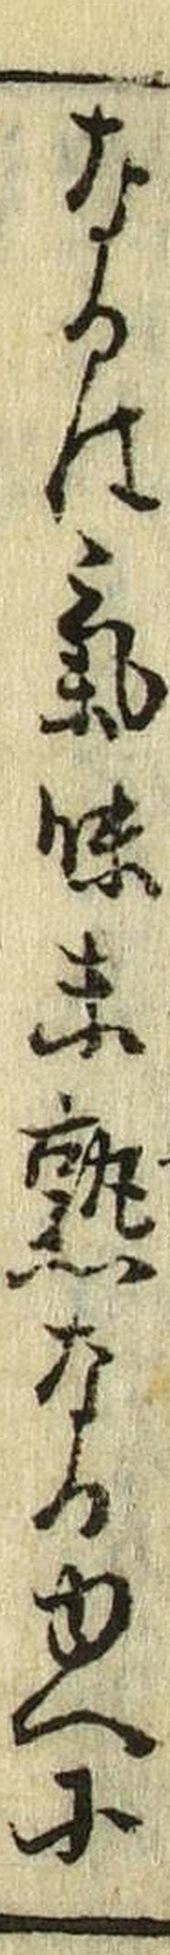なるは気味未熟なるゆへに
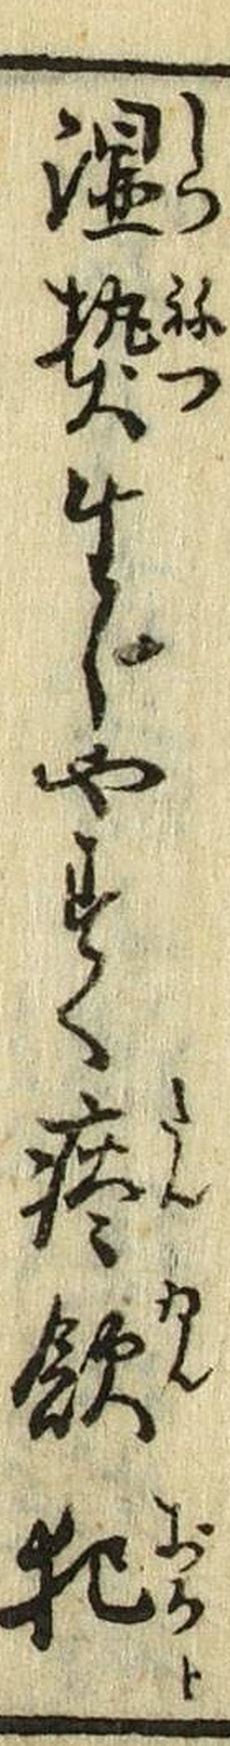湿熱生じやすく痰飲犯
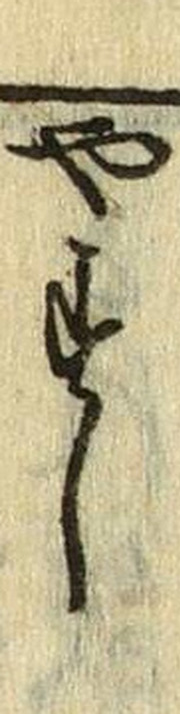やすし
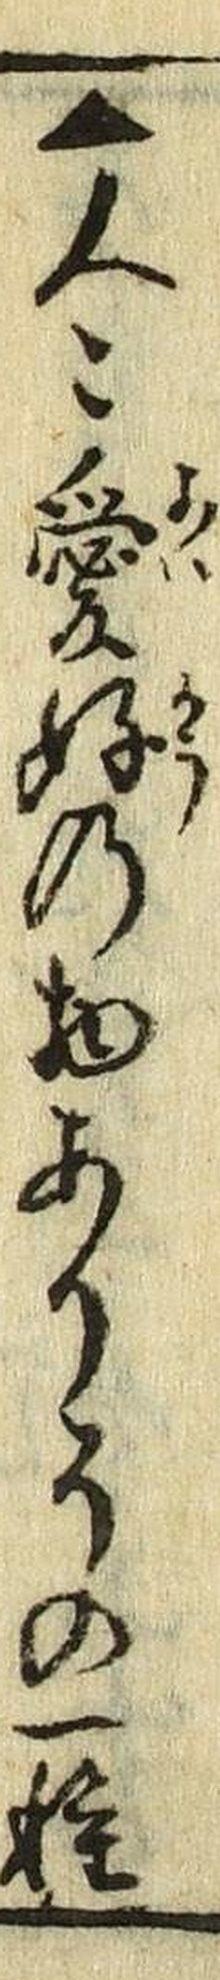▲人々愛好の物ありその一種
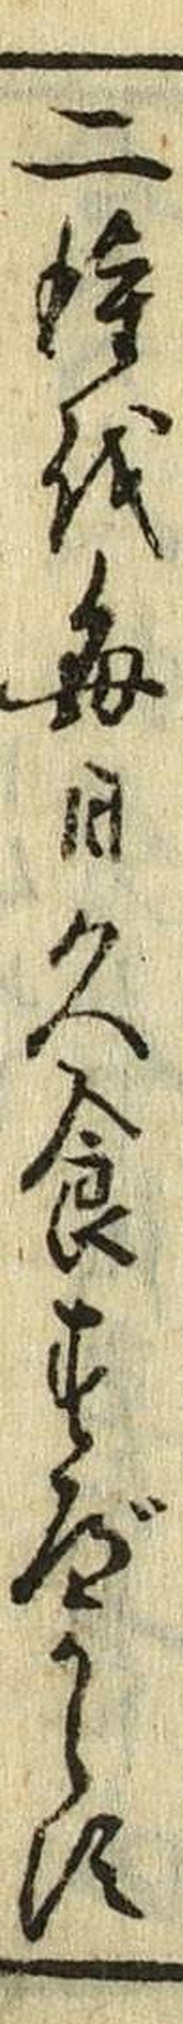二種を毎日久食すべからす
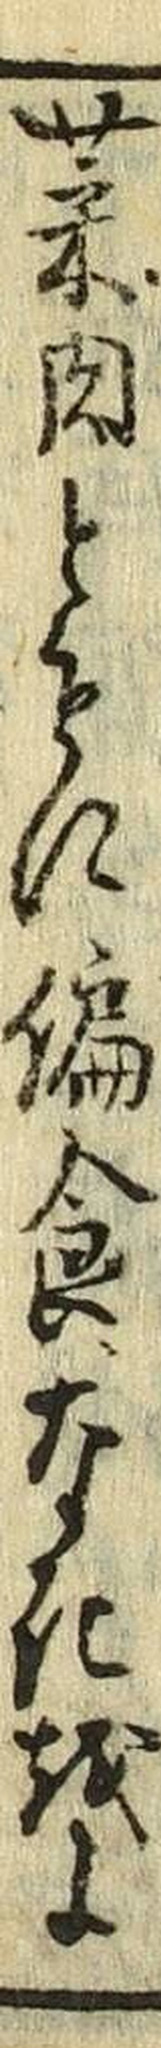菜肉ともに偏食なきをよ
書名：居家養生記
